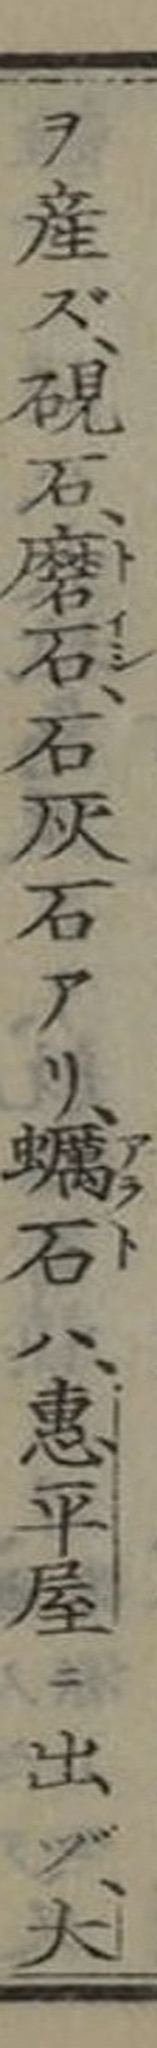ヲ産ズ、硯石、磨石、石灰石アリ、蠣石ハ、恵平屋ニ出ヅ、大
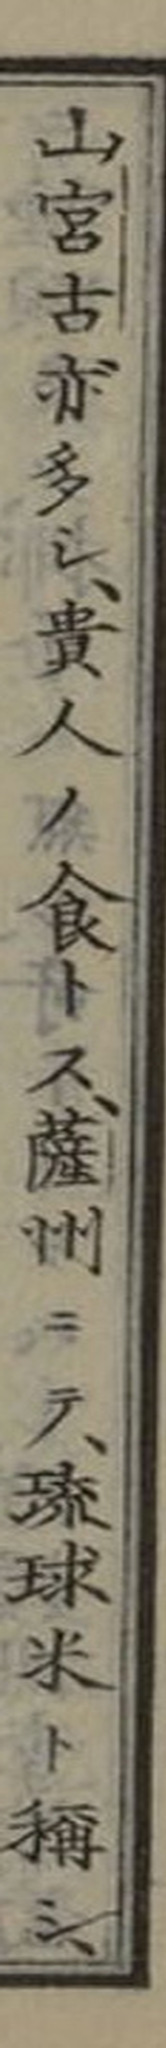山宮古亦多シ、貴人ノ食トス、薩州ニテ、琉球米ト称シ、
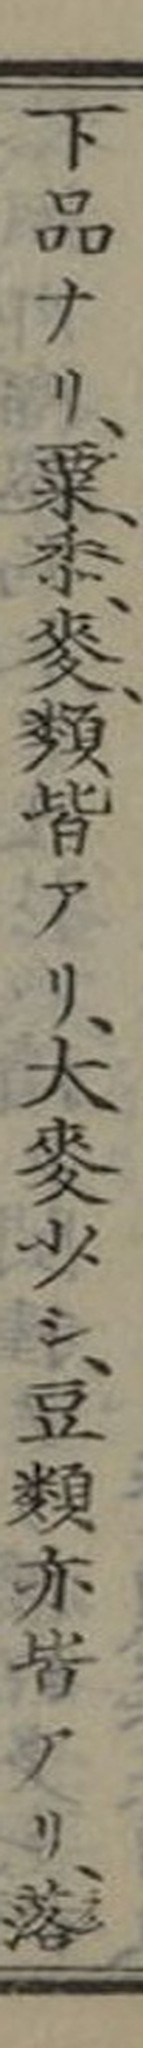下品ナリ、粟、黍、麦、類皆アリ、大麦少シ、豆類亦皆アリ、落
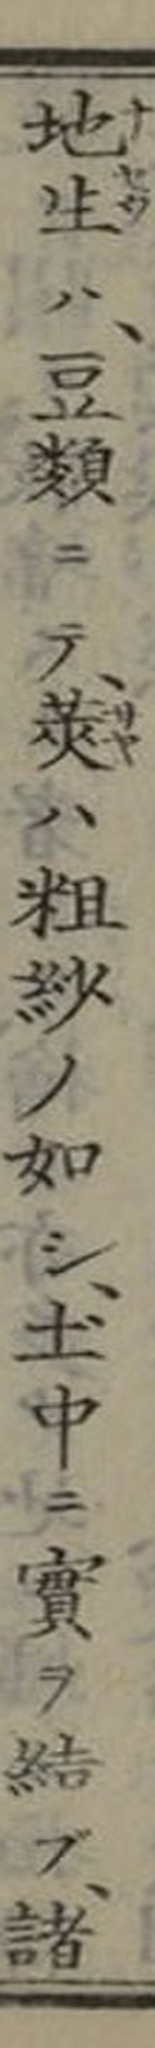地生ハ、豆類ニテ、莢ハ粗紗ノ如シ、土中ニ実ヲ結ブ、諸
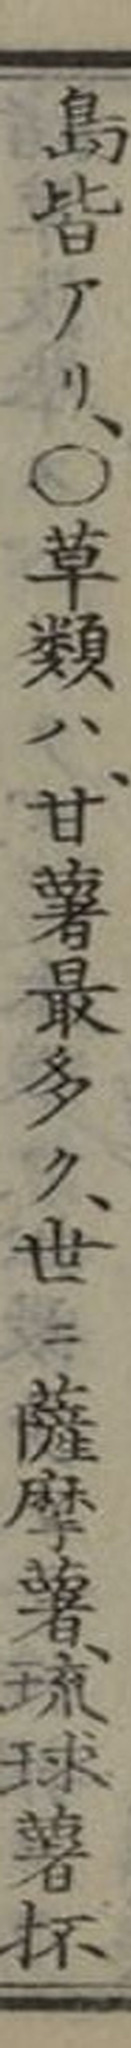島皆アリ、○草類ハ、甘薯最多ク、世ニ薩摩薯、琉球薯抔
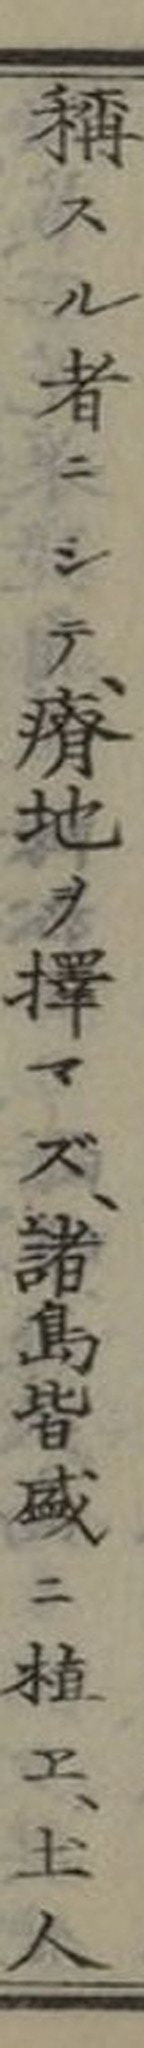称スル者ニシテ、瘠地ヲ択マズ、諸島皆盛ニ植ヱ、土人
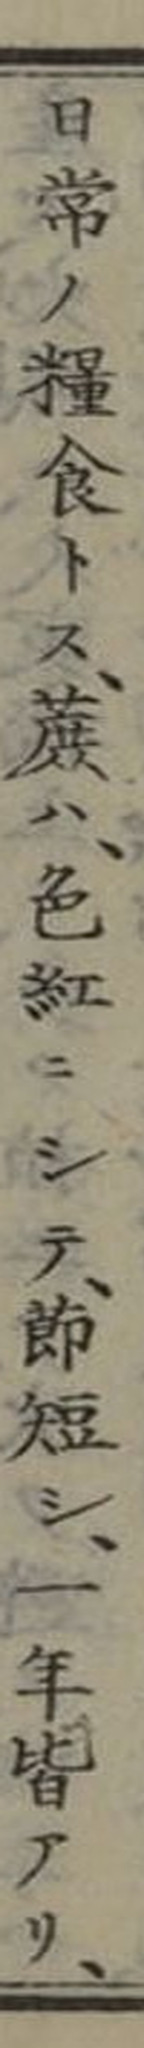日常ノ糧食トス、蔗ハ、色紅ニシテ、節短シ、一年皆アリ、
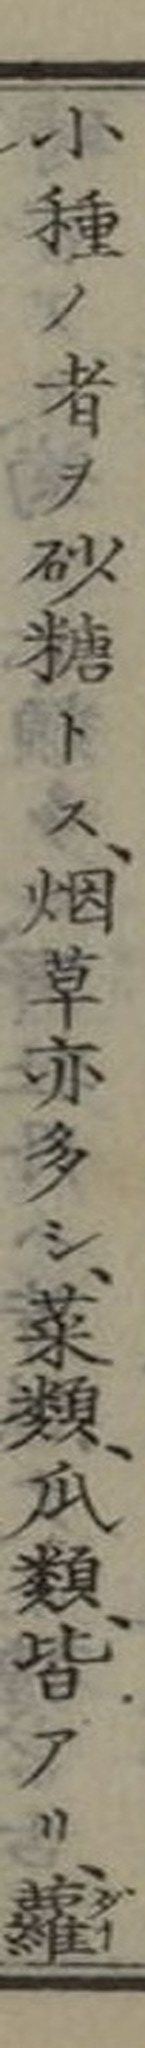小種ノ者ヲ砂糖トス、煙草亦多シ、菜類、瓜類、皆アリ、蘿
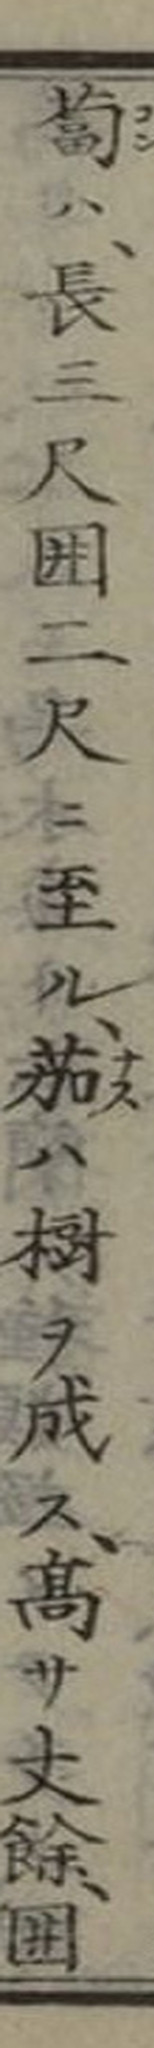蔔ハ、長三尺囲二尺ニ至ル、茄ハ樹ヲ成ス、高サ丈余、囲
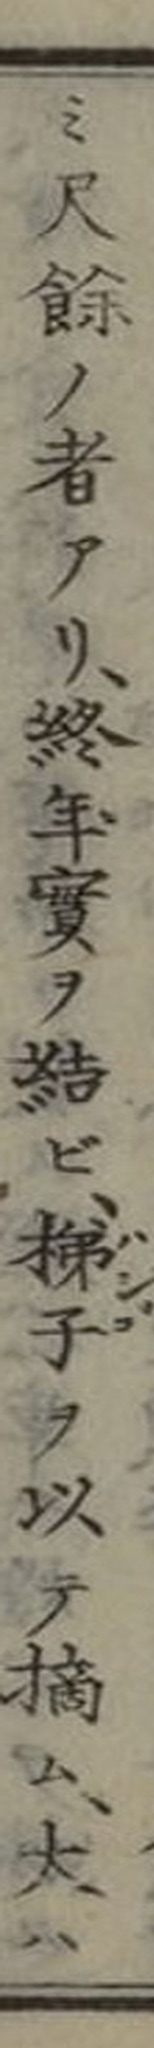ミ尺余ノ者アリ、終年実ヲ結ビ、梯子ヲ以テ摘ム、大ハ
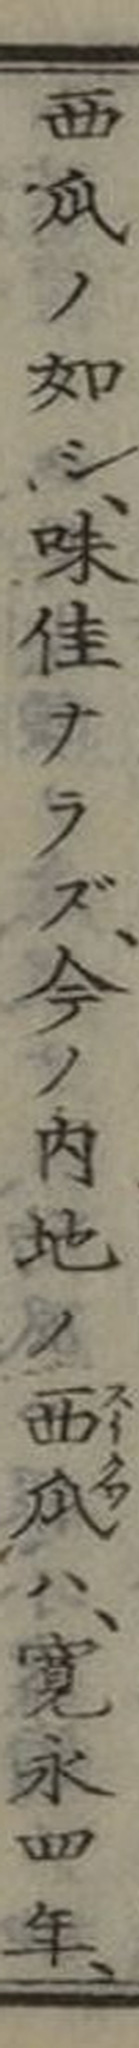西瓜ノ如シ、味佳ナラズ、今ノ内地ノ西瓜ハ、寛永四年、
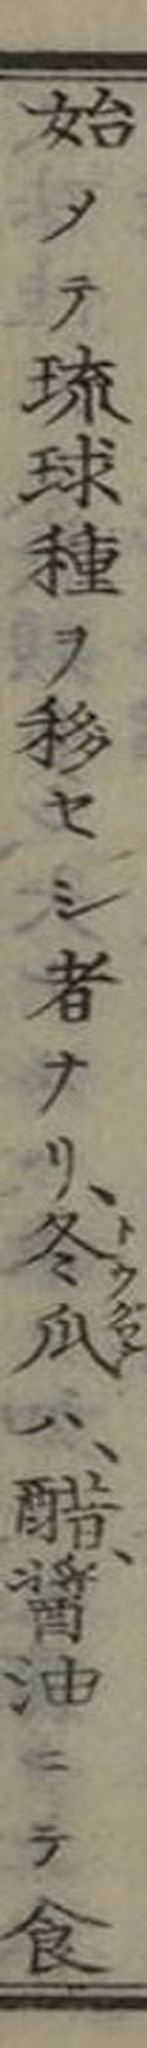始メテ琉球種ヲ移セシ者ナリ、冬瓜ハ、醋、醤油ニテ食

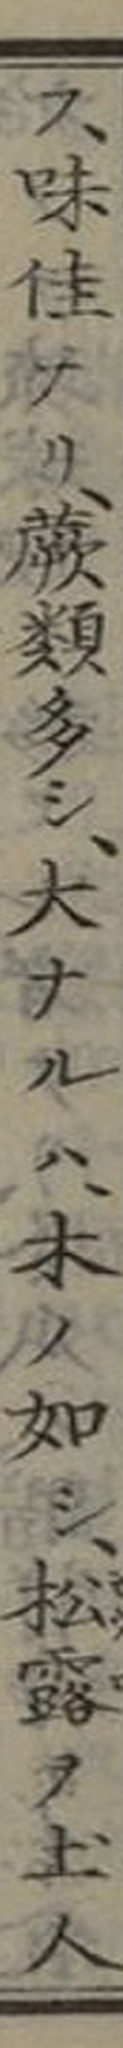フ、味佳ナリ、蕨類多シ、大ナルハ、木ノ如シ、松露ヲ土人
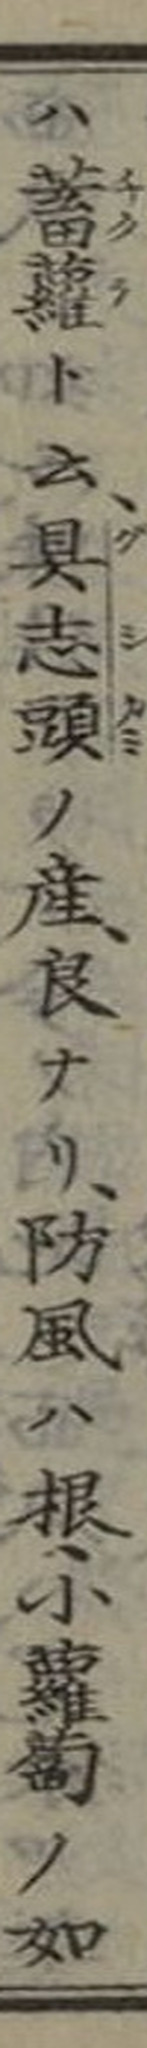ハ蓄蘿ト云、具志頭ノ産、良ナリ、防風ハ根、小蘿蔔ノ如
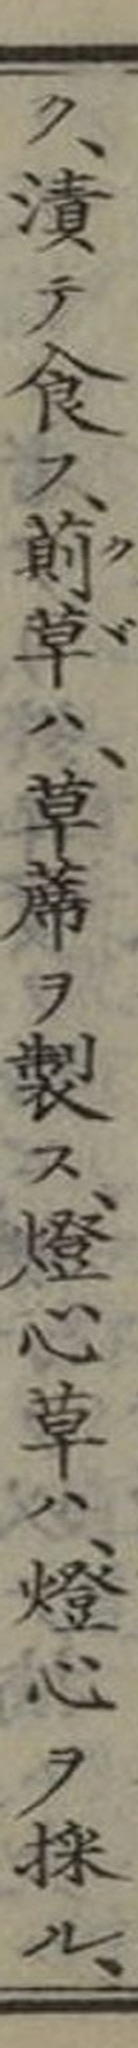ク、漬テ食フ、草ハ、草蓆ヲ製ス、灯心草ハ、灯心ヲ採ル、
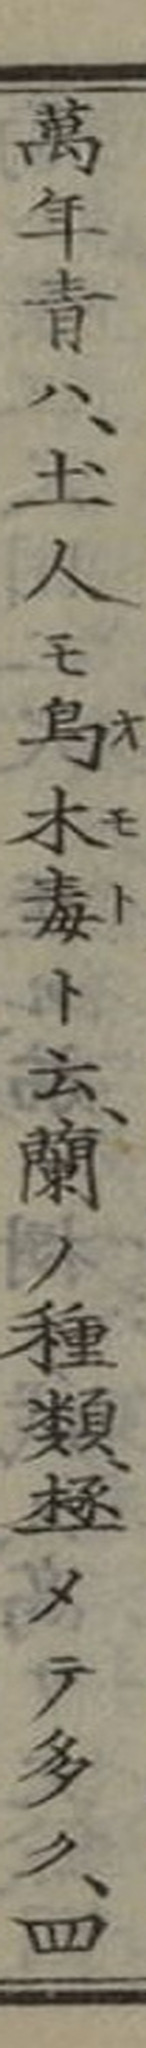万年青ハ、土人モ烏木毒ト云、蘭ノ種類、極メテ多ク、四
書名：琉球新誌 図附 上
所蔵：University of the Ryukyus Library
